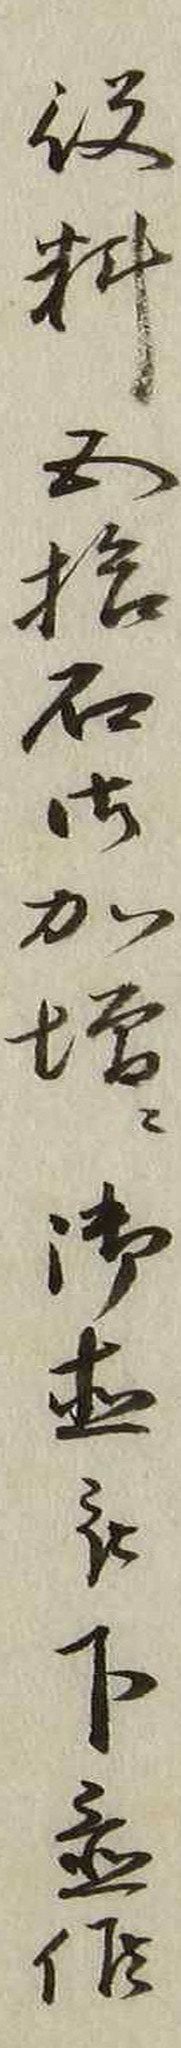役料五拾石御加増ニ御直被下置候
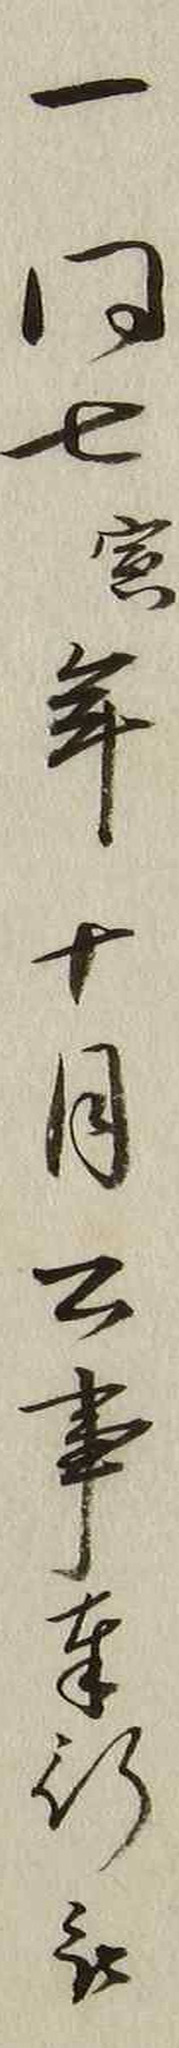一同七寅年十月公事奉行被
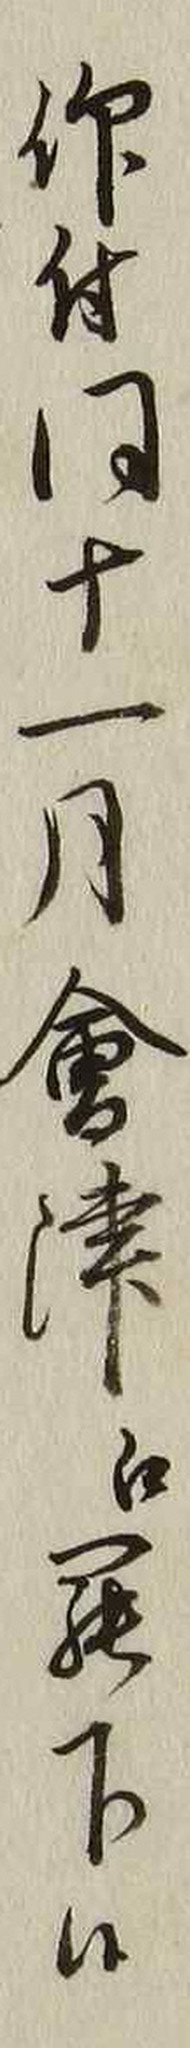仰付同十一月会津江罷下候
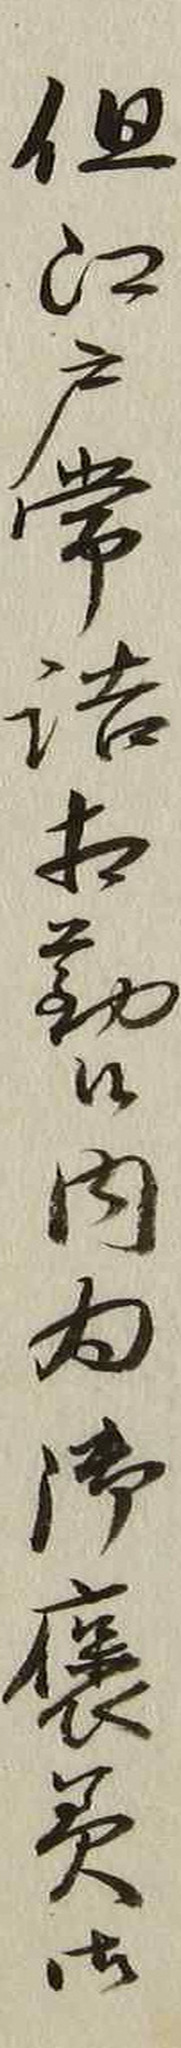但江戸常詰相勤候内為御褒美御
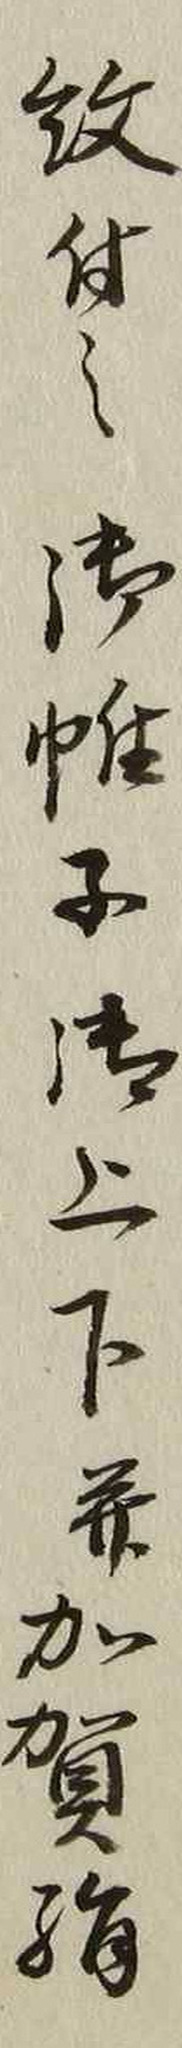紋付之御帷子御上下并加賀絹
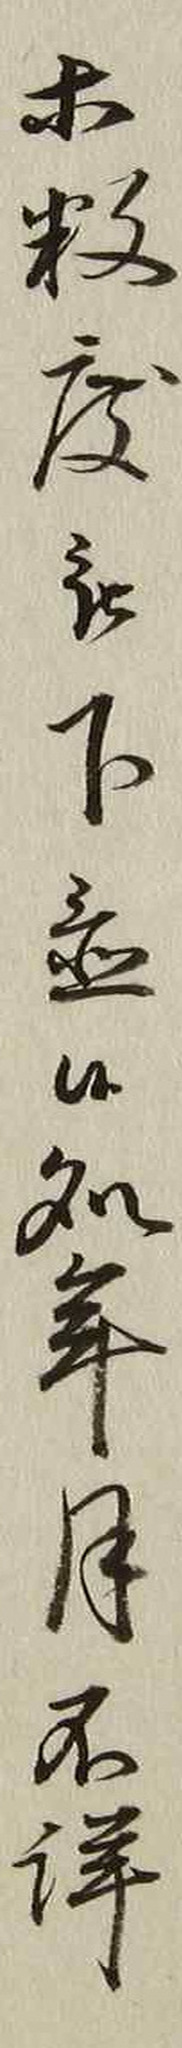等数度被下置候処年月不詳
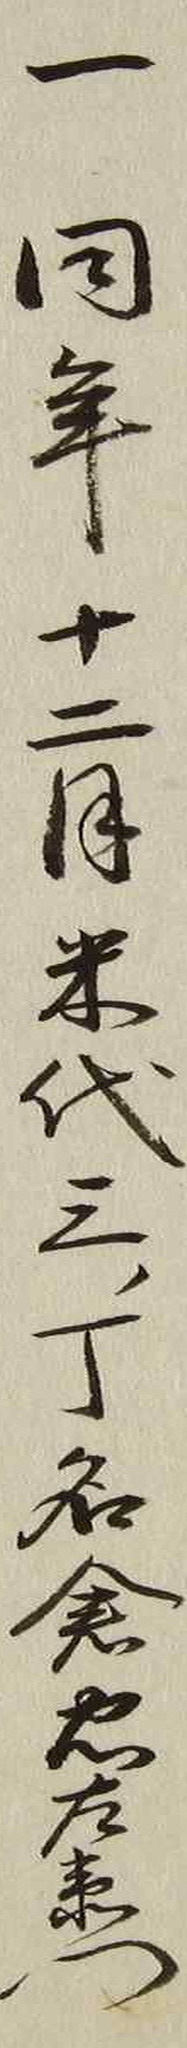一同年十二月米代三ノ丁名倉忠左衛門
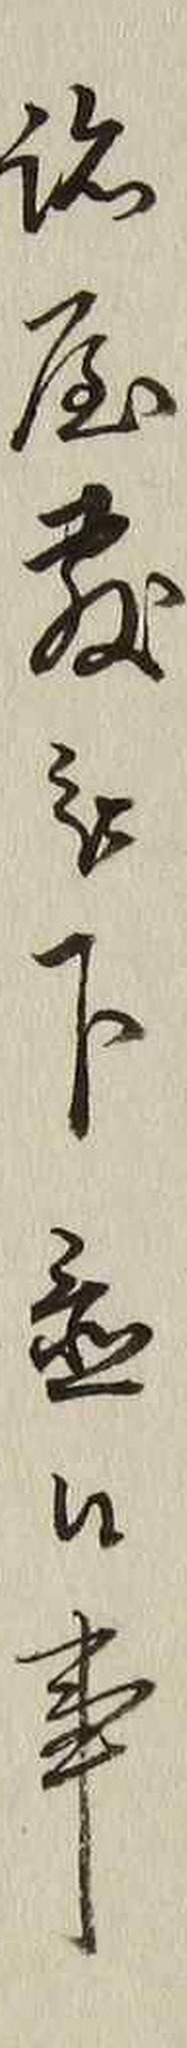跡屋敷被下置候事
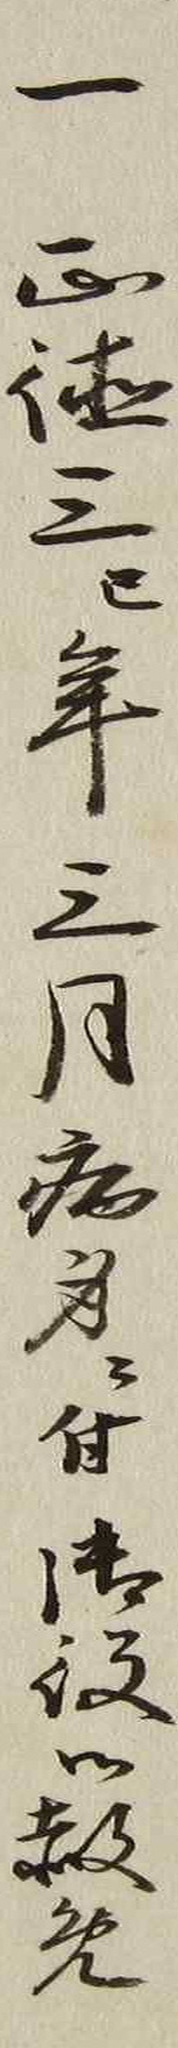一正徳三巳年三月病身ニ付御役御赦免
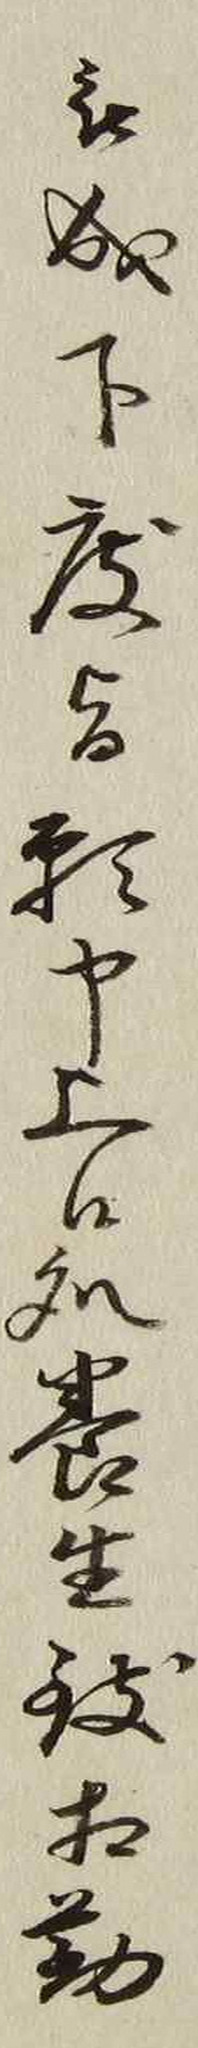被成下度旨願申上候処養生致相勤
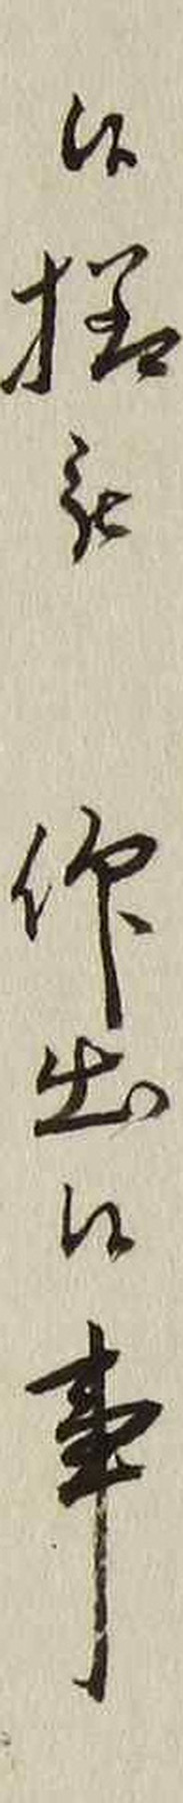候様被仰出候事
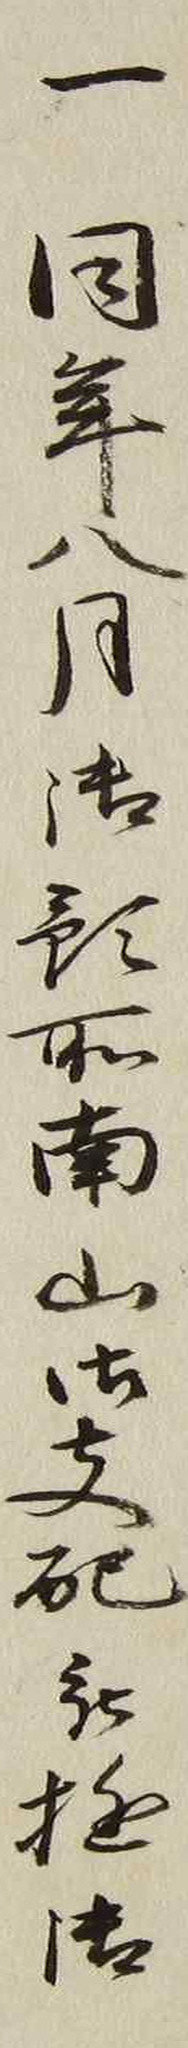一同年八月御預所南山御支配被遊御
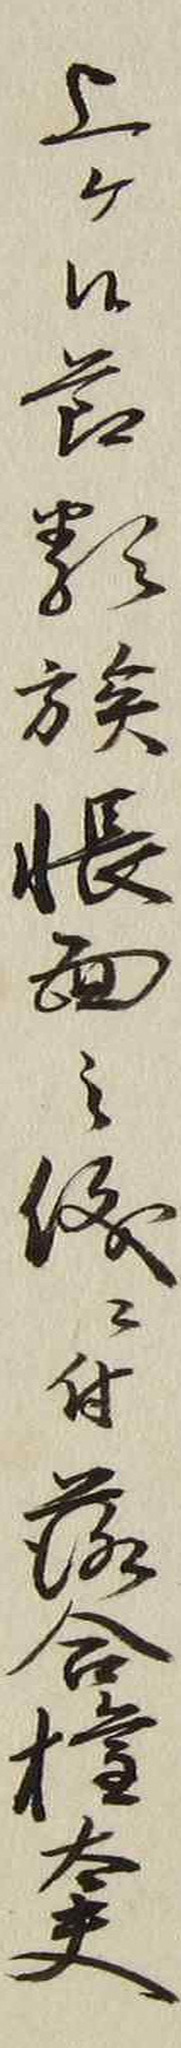上ケ候節類族帳面之儀ニ付落合権太夫
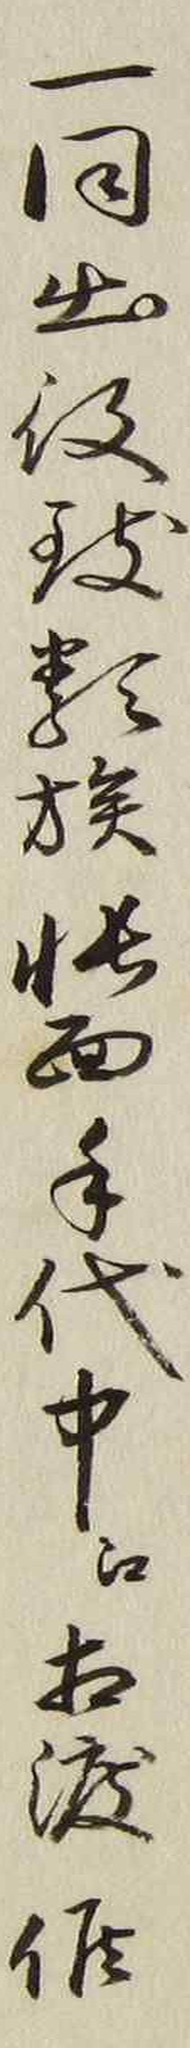一同出役致類族帳面手代中江相渡候

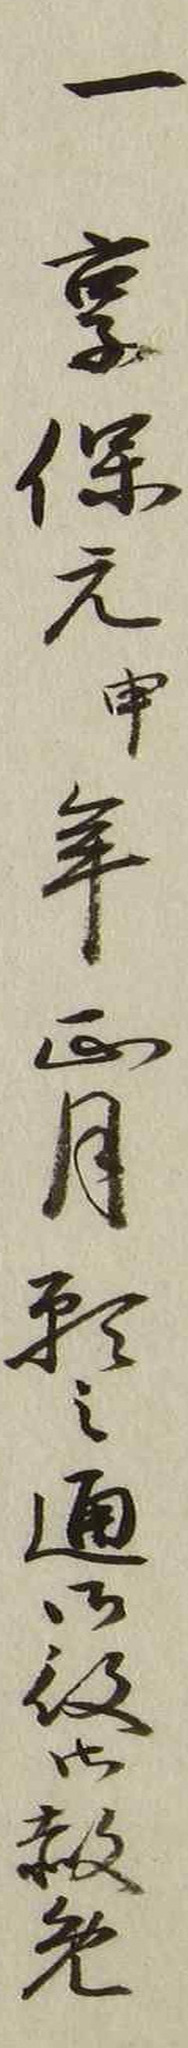一享保元申年正月願之通御役御赦免
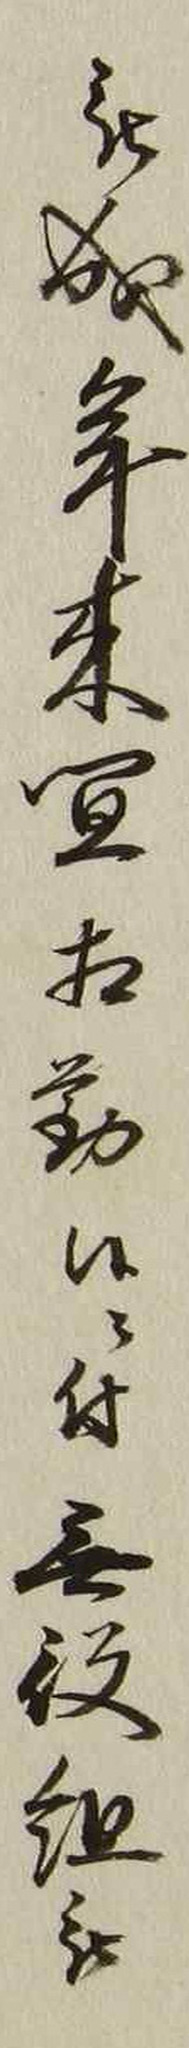被成年来宜相勤候ニ付無役組被
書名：諸士系譜　巻之149　そ之部2
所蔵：会津若松市立会津図書館
